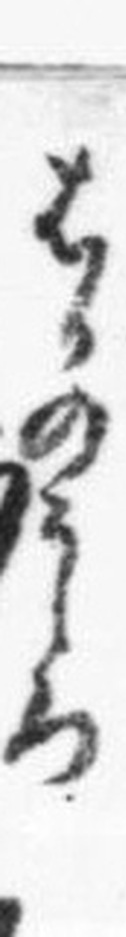はかのうら
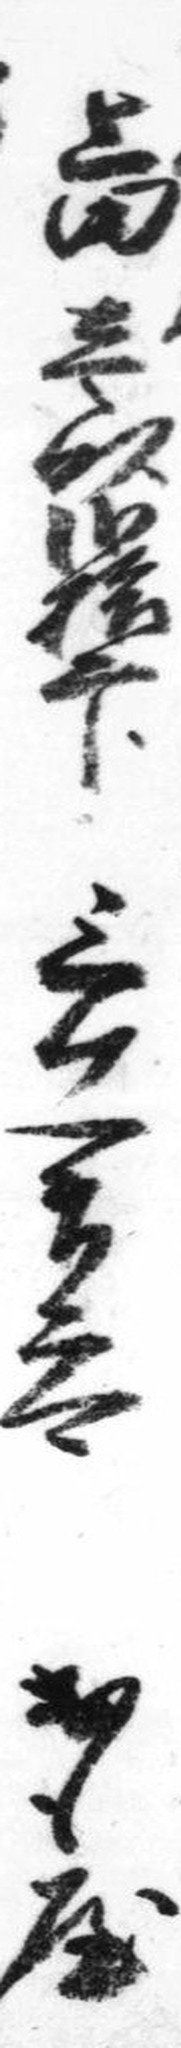上田壱畝廿拾二分三斗一升二合出〆屋
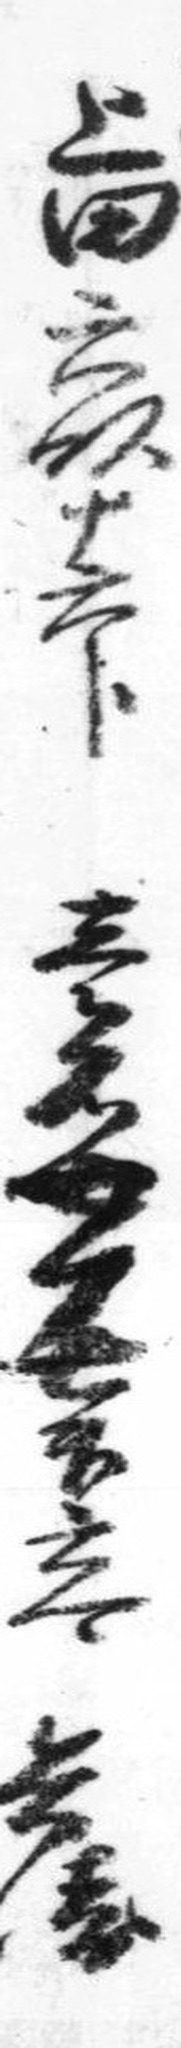上田六畝十六分壱石五斗七升六合
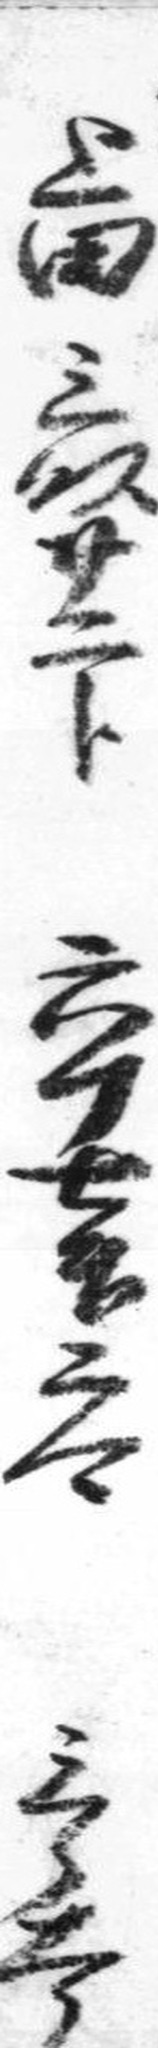上田三畝廿二分六斗七升二合三郎太郎
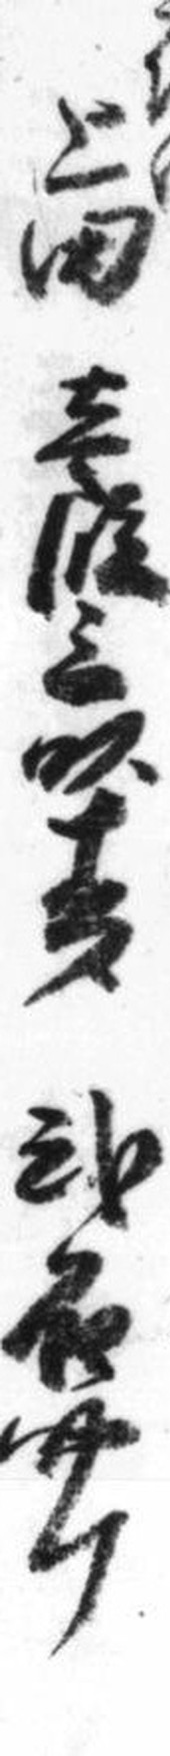上田一段三畝十歩弐石四斗同人

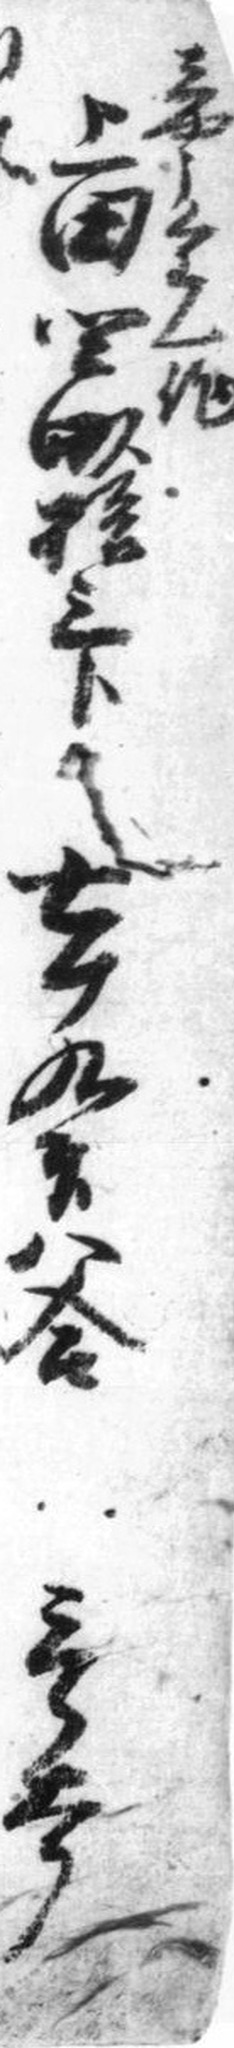上田四畝拾三分七斗九升八合三郎太郎
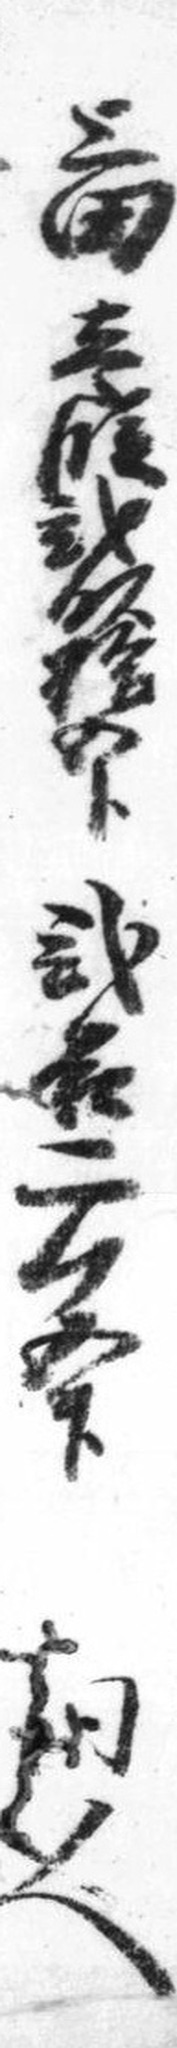上田壱反弐畝拾五分弐石二斗五升同人
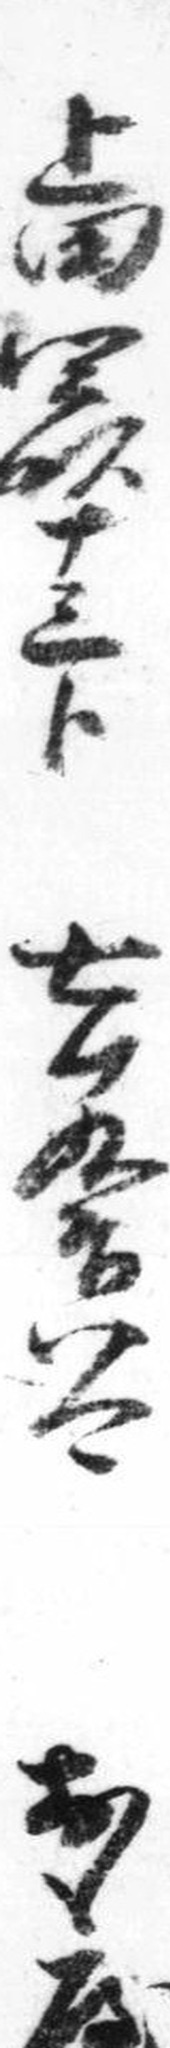上田四畝十三分七斗九升八合出〆屋
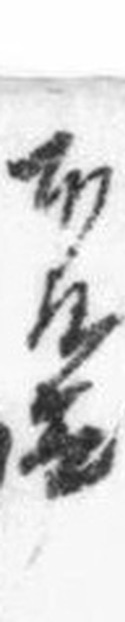本屋敷
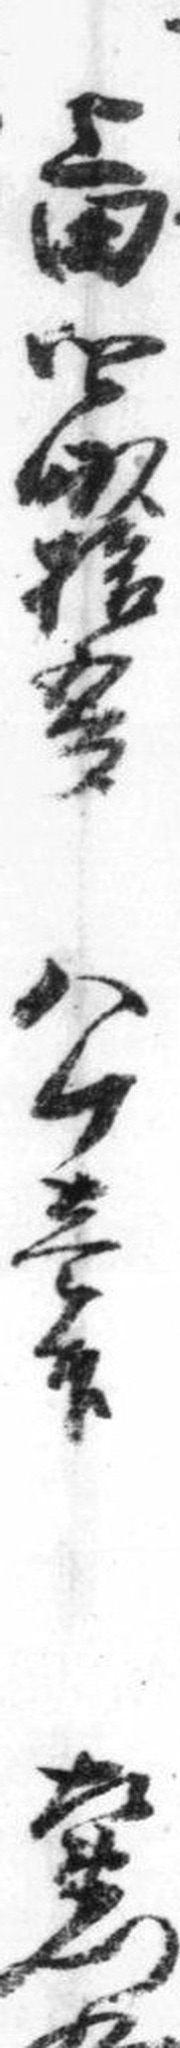上田四畝拾歩八斗壱升左衛門九郎
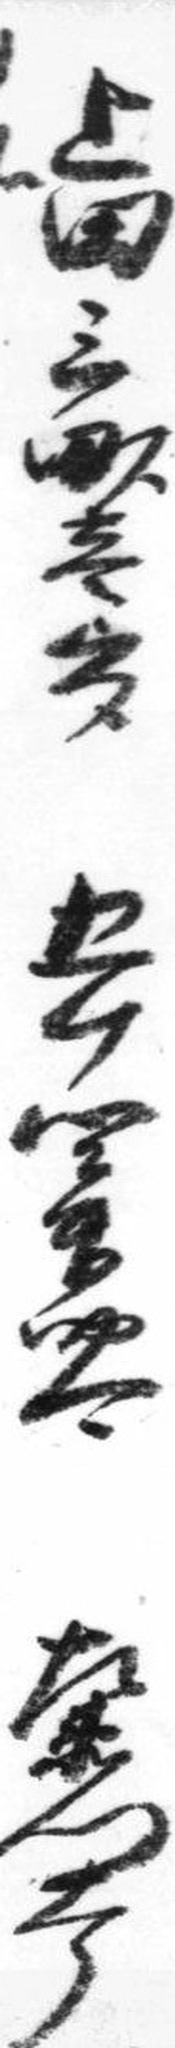上田三畝壱歩五斗四升四合左衛門太郎
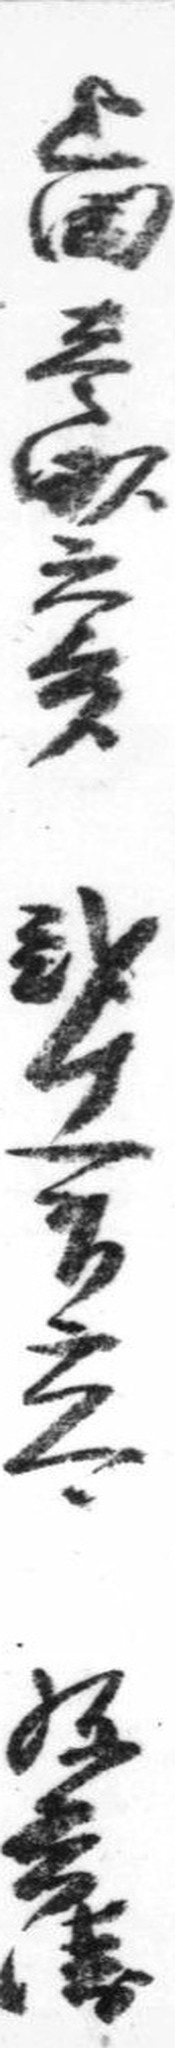上田壱畝六歩弐斗一升六合孫兵衛
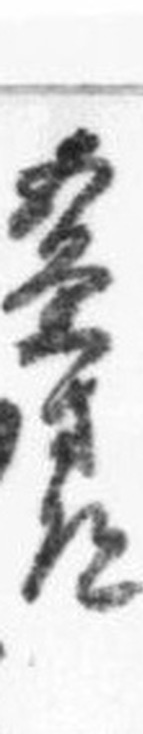五条方道
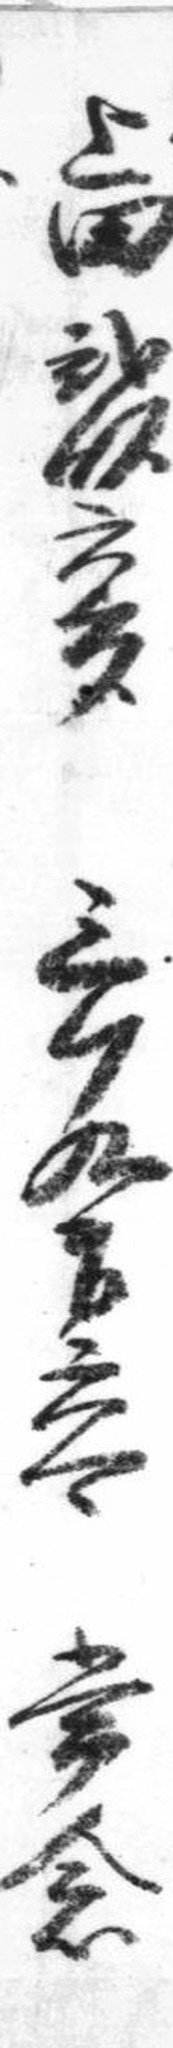上田弐畝六歩三斗九升六合常念
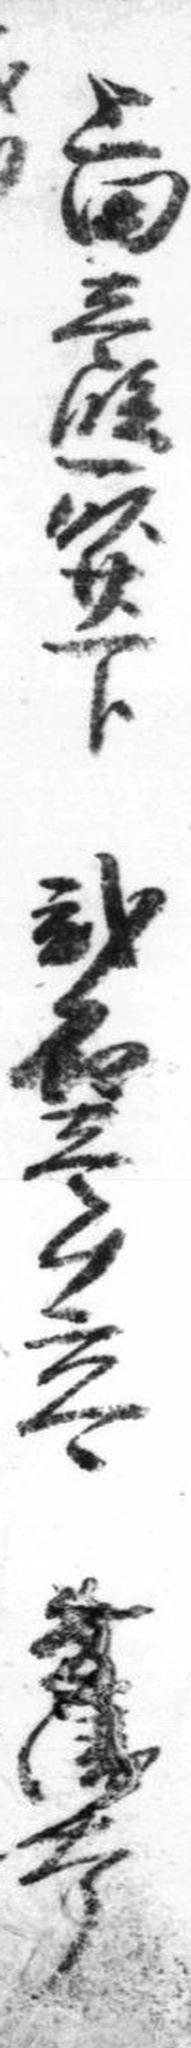上田壱段一畝廿一分弐石壱斗六合兵衛太郎
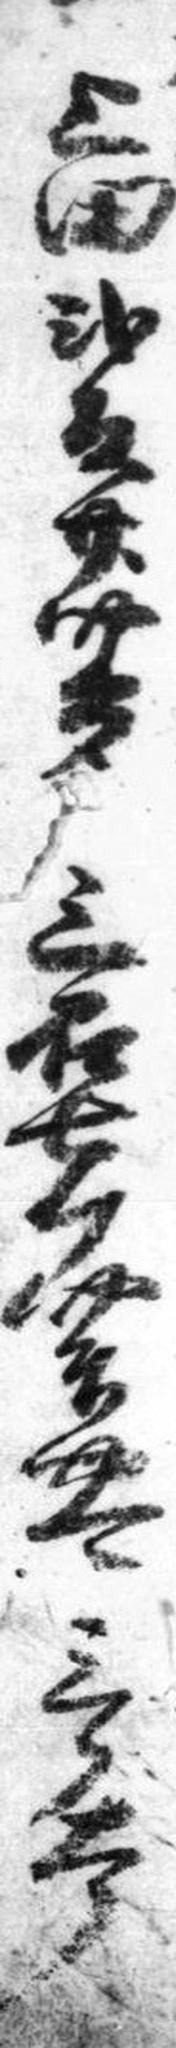上田弐反廿四歩三石七斗四升四合三郎太郎
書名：越前国大野郡今井村御検地帳
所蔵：福井県文書館 Fukui Prefectural Archives
